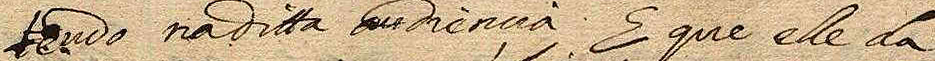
tendo na ditta audiençia E que elle da
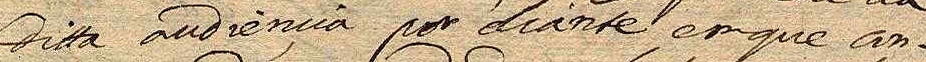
ditta audiençia por diante em que con
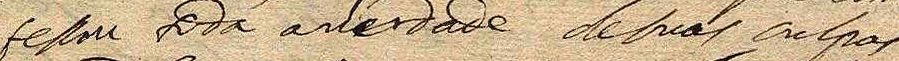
fessou toda a uerdade de suas culpas
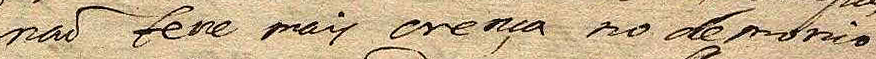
naõ teve mais crença no demonio
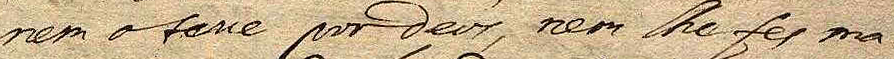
nem o teue por deos, nem lhe fes ma
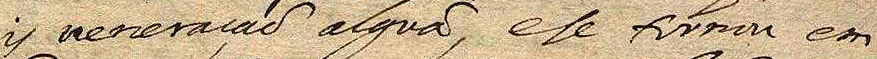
is ueneraçaõ alguā, e se tornou em
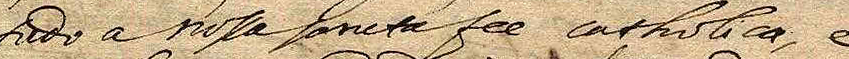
tudo a nossa sancta fee catholica, e
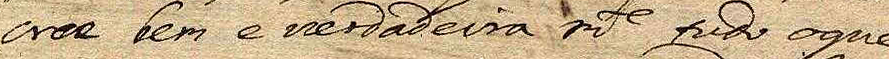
cree bem e verdadeira m.te tudo o que
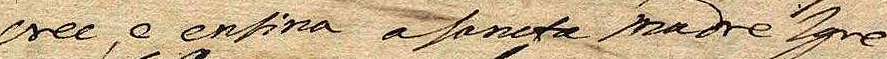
cree, e ensina a Sancta madre Igre
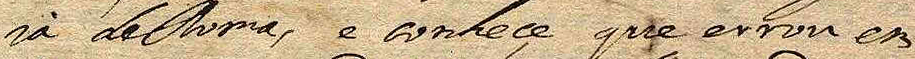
ia de Roma, e conheçe que errou em
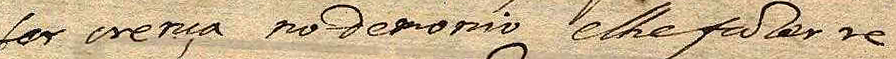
ter crença no demonio e lhe fazer re
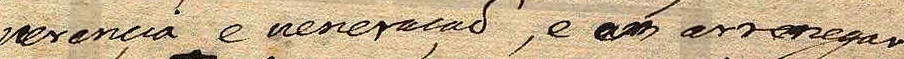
verençia e veneraçaõ, e em arrenegar
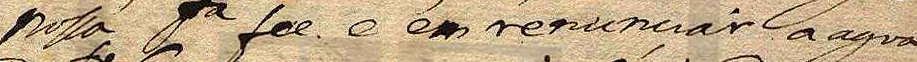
nossa S.ta fee. e em renunçiar a agoa
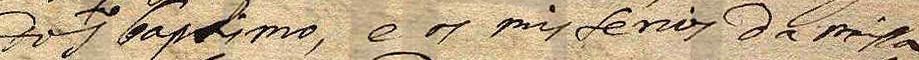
do S.to baptismo, e os misterios da missa
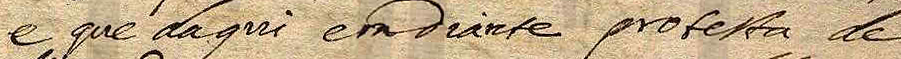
e que daqui em diante protesta de
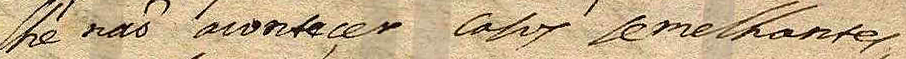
lhe naõ aconteçer casos semelhantes,
